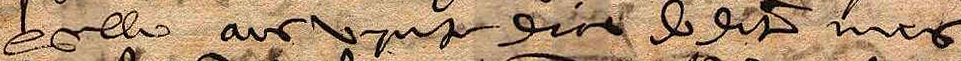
e sello aos vynte dias do dito mes
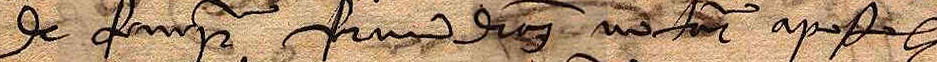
de feuerro fernā diaz notayro apostoly
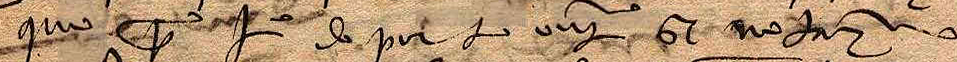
quo p̄or Jo do porto outrosy notayro
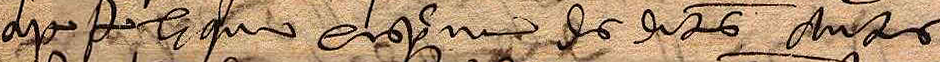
apostolyquo e esp̄uā dos dito Autos
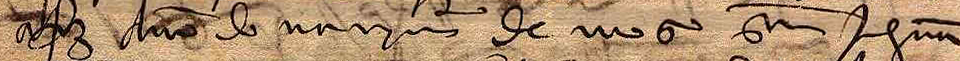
a fez An̄o do nacymto de noso s̄or Jhūu
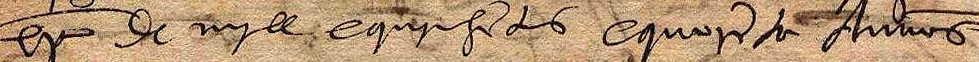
xp̄o de mjll e qujnhētos e quorēta Annos
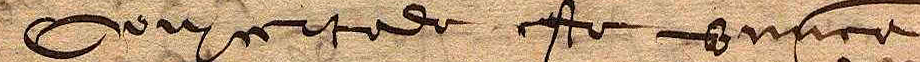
Comcertada esta sennç̄a
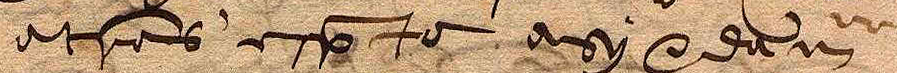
atras esp̄ta asy e da mra
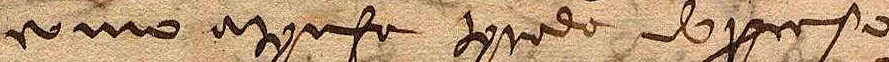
como a tynha tyrada do ꝓceso
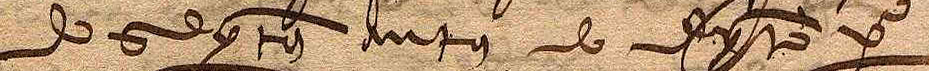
dos dytꝯ autꝯ do dyto ꝑo
